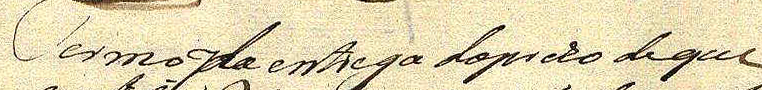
Termo da entrega do prezo de que
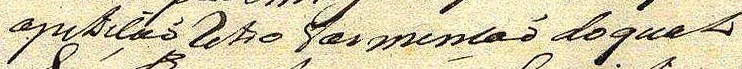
a petiçaõ Retro faz mençaõ do qual
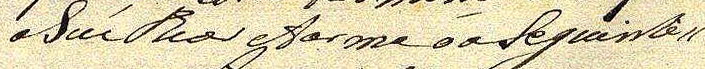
a Seu Reo eforma o a seguinte//
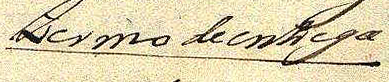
Termo de entrega
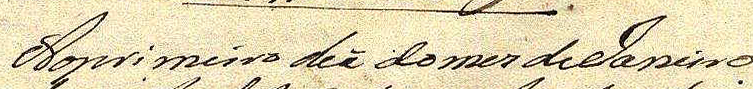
Ao primeiro diá do mes de Ianeiro
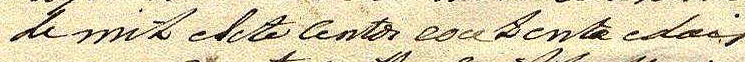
de miL e setecentos e outenta e dois
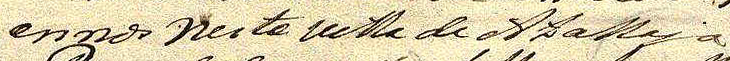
annos nesta villa de Atallaja
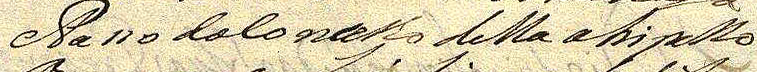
Passo do Concelho della ahi pello
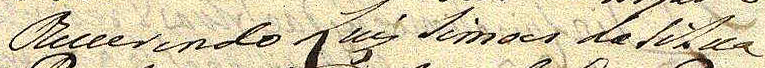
Reuerendo Luis Simoes da Silua
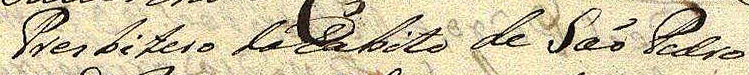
Presbitero do habito de São Pedro
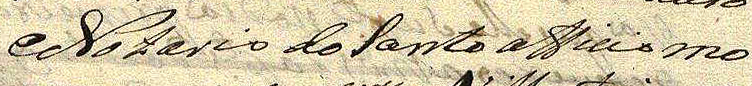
e Notario do Santo officio mo
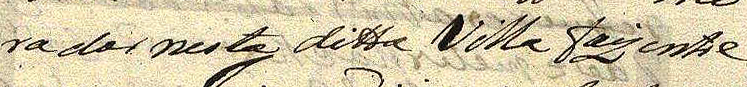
rador nesta ditta Villa faiz entre
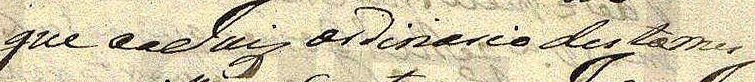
gue ao Iuis ordinario desta mes
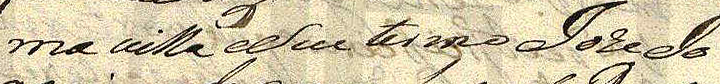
ma uilla e Seu termo Ioze Io
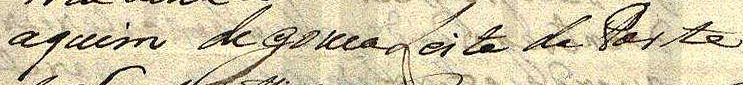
aquim de gouea Leite da Parte
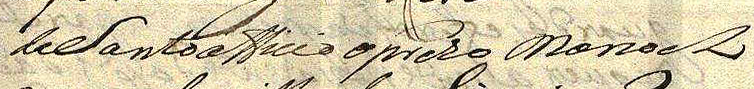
de Santo officio o prezo Manoel
